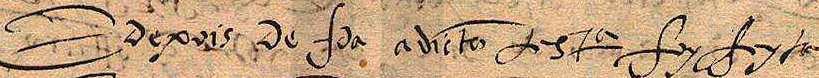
E depois de Jda a dīcta testa foy feyta
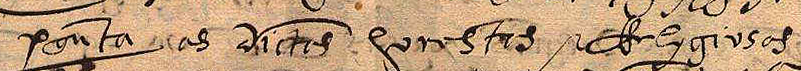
ꝑgūta as dīctas honestas e Relygiosas
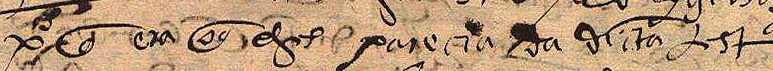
pas q̄ era o q̄ lhes parecia da dīcta testa
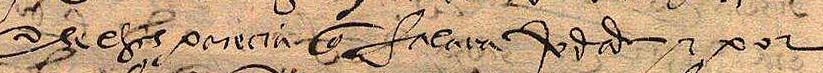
e se lhes parecia q̄ falava ꝟdade e por
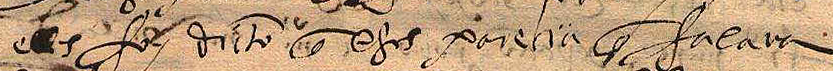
elles foy dīcto q̄ lhes parecia q̄ falava
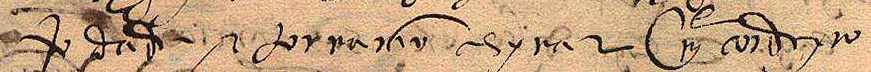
ꝟdade e tornarão asynar mel cordeyro
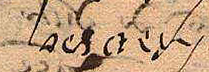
o escreuy
